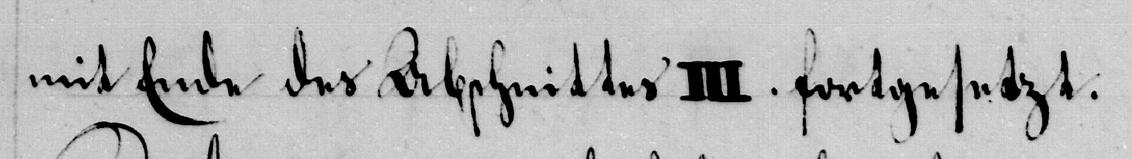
mit Ende des Abschnittes III. fortgesetzt.
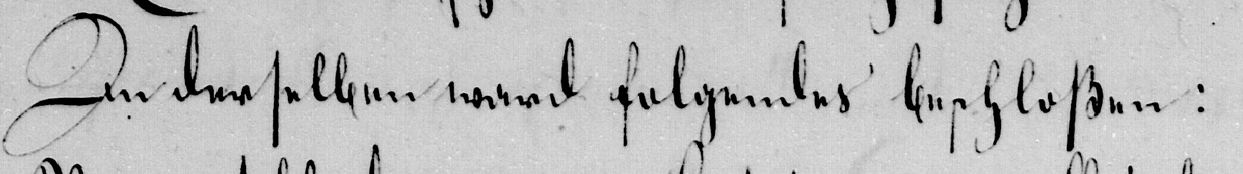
In derselben wird folgendes beschloßen:
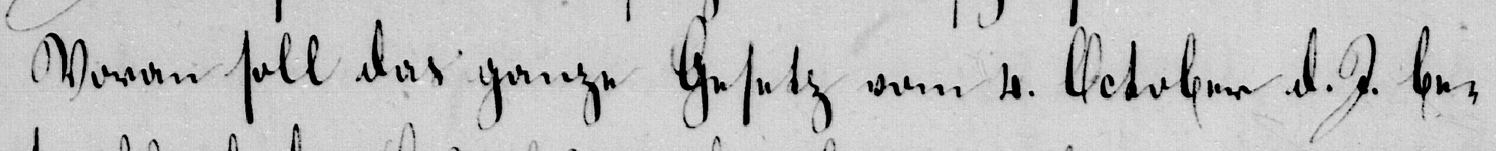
Voran soll das ganze Gesetz vom 4. October d. J. be¬
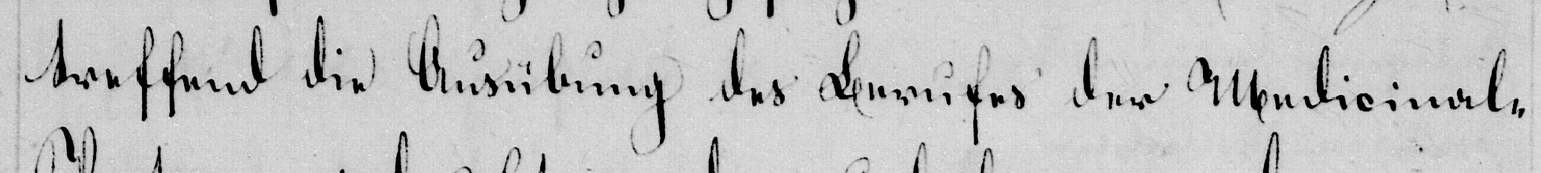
treffend die Ausübung des Berufes der Medicina¬
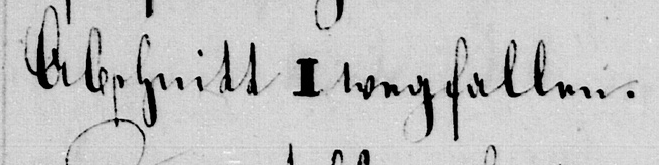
Abschnitt I. wegfallen.
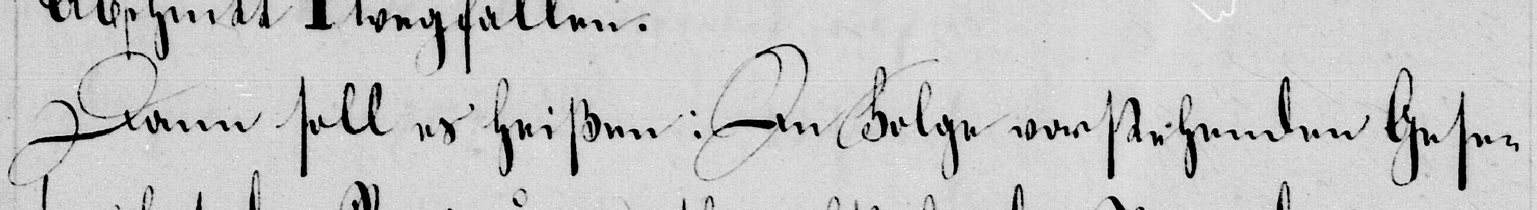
Dann soll es heißen: In Folge vorstehenden Gese¬
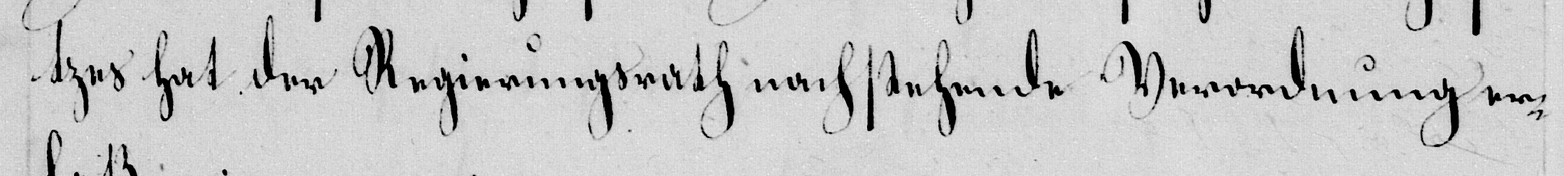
tzes hat der Regierungsrath nachstehende Verordnung er¬
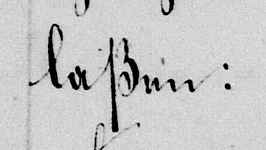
laßen:
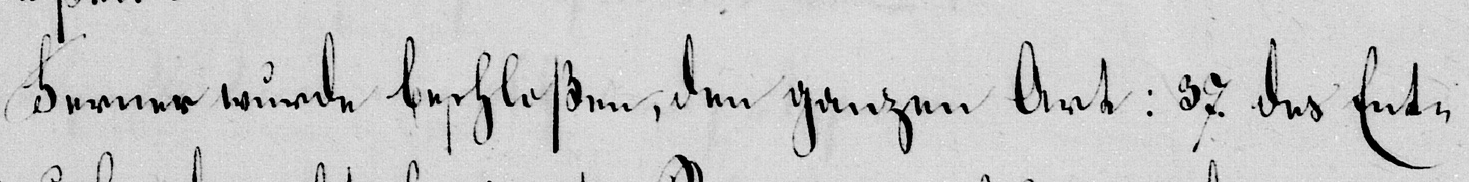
Ferner wurde beschloßen, den ganzen Art: 37. des Ent¬
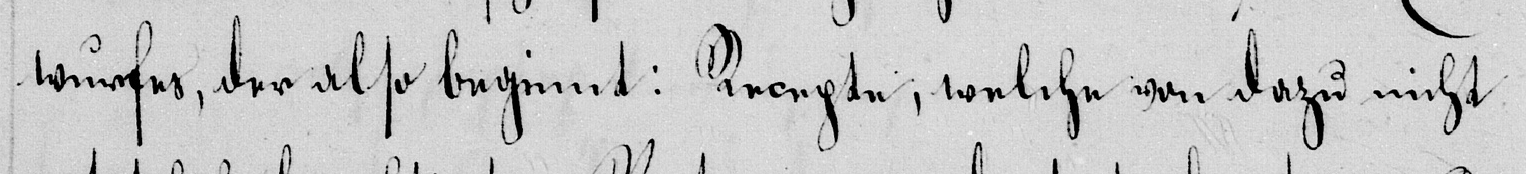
wurfes, der also beginnt: Recepte, welche von dazu nicht
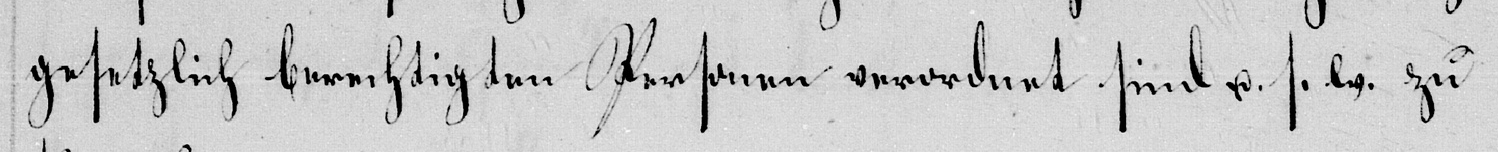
gesetzlich berechtigten Personen verordnet sind u. s. w. zu
